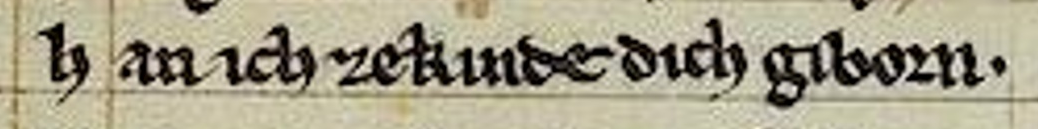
Han ich zekinde dich giborn.
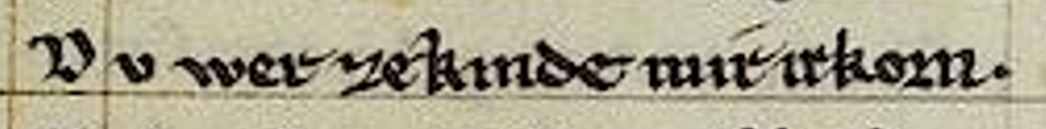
Dv wer zekinde mir irkorn.
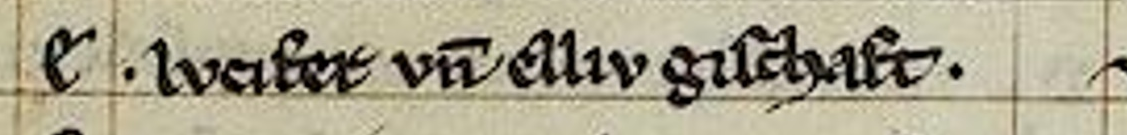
E. lvcifer vn(d) elliv giſchaft.
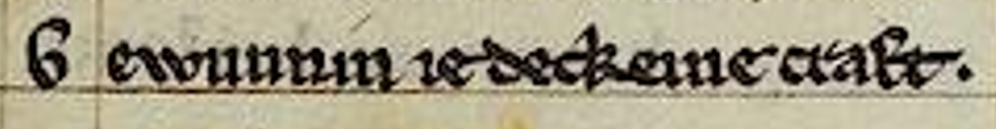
Gewunnin ie deckeine craft.
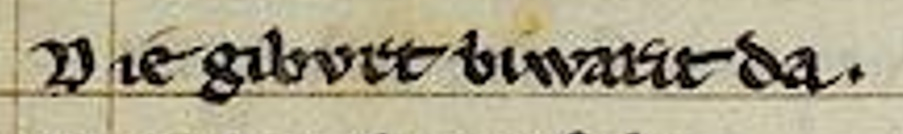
Die gibvrt biwarit da.
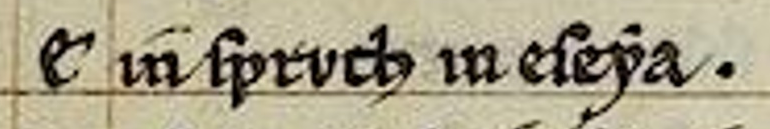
Ein ſprvch in eſeya.
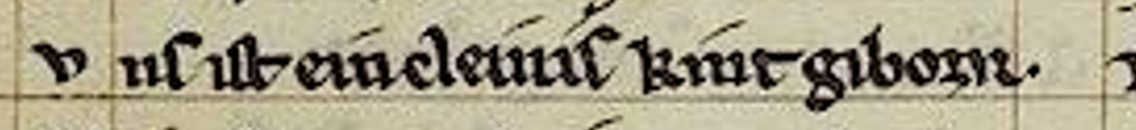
Vnſ iſt ein cleinſ kint giborn.
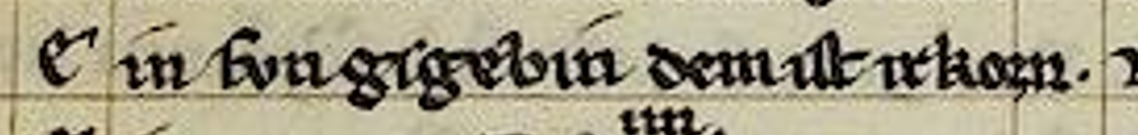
Ein ſvn gigebin dem iſt irkorn.
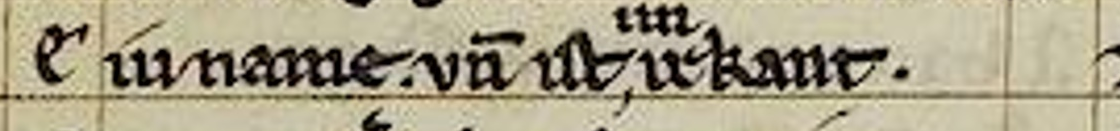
Ein name. vn(d) iſt °(im) irkant.
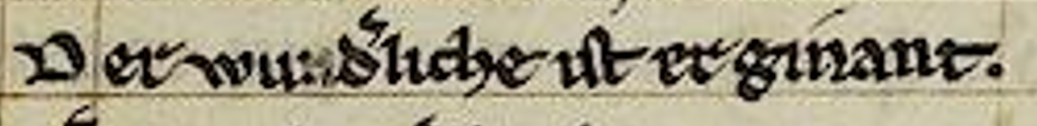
Der wund(er)liche iſt er ginant.
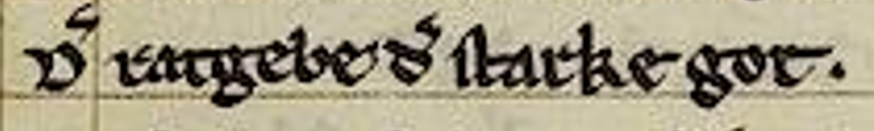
D(er) ratgebe d(er) ſtarke got.
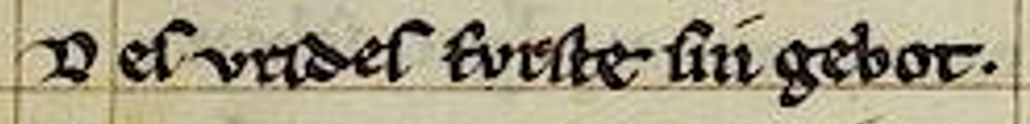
Deſ vrideſ fvrſte ſin gebot.
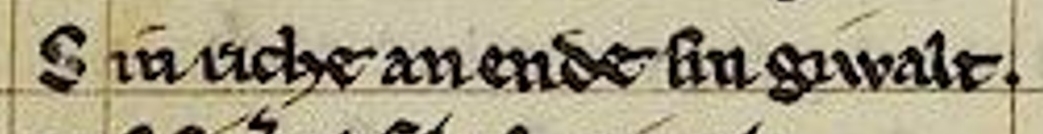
Sin riche an ende ſin giwalt.
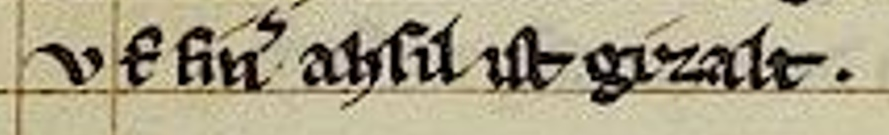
Vf ſin(er) ahſil iſt gizalt.
